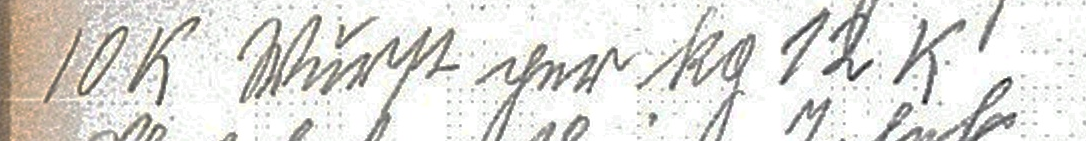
10 K Wurst per kg 12 K
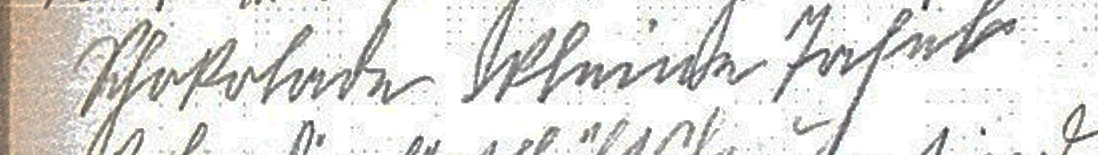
Schokolade kleine Tafel
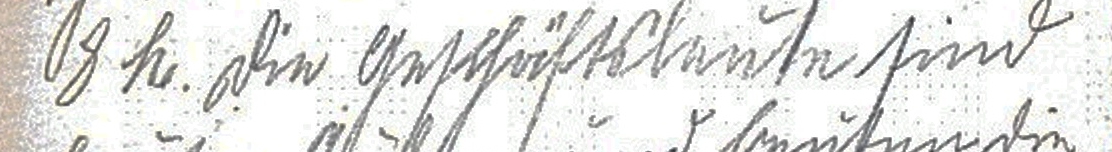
8 k. Die Geschäftsleute sind
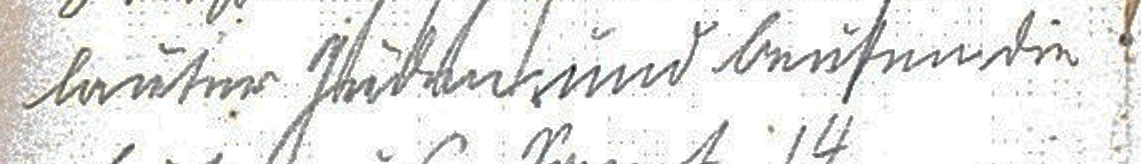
lauter Juden und beuten die
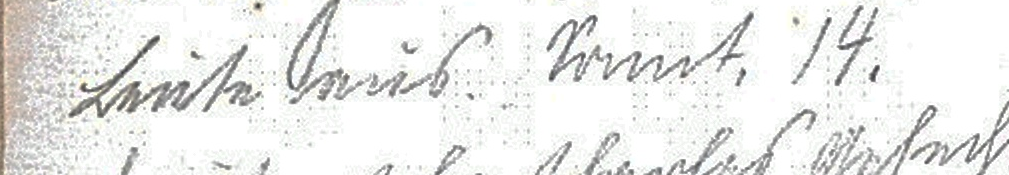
Leute aus. Sonnt 14.
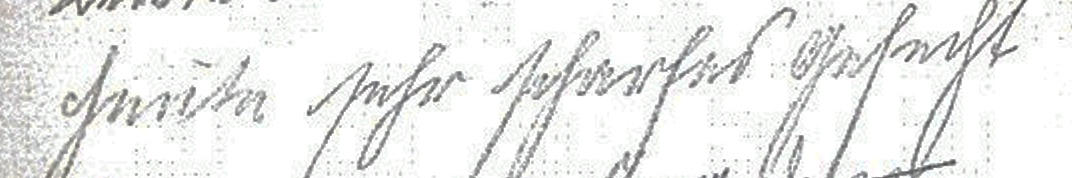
Heute sehr scharfes Gefecht
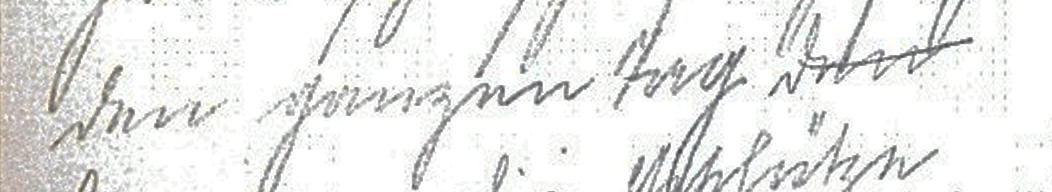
den ganzen Tag
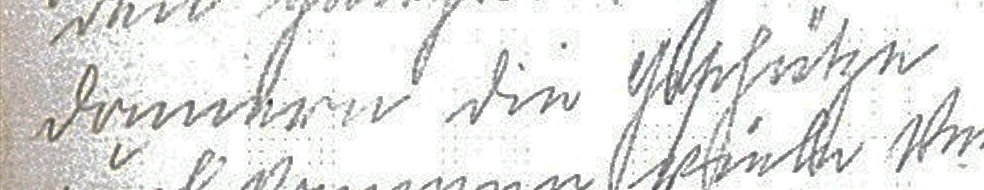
donnern die Geschütze
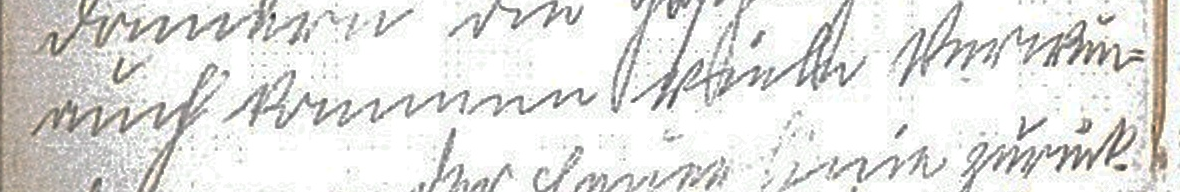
auch kommen viele Verwund-
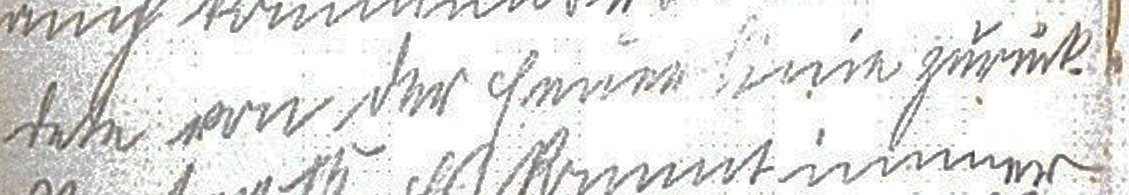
dete von der Feuerlinie zurück.
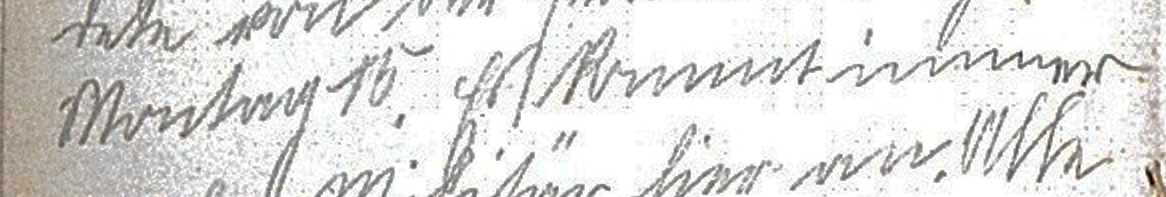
Montag 15. Es kommt immer
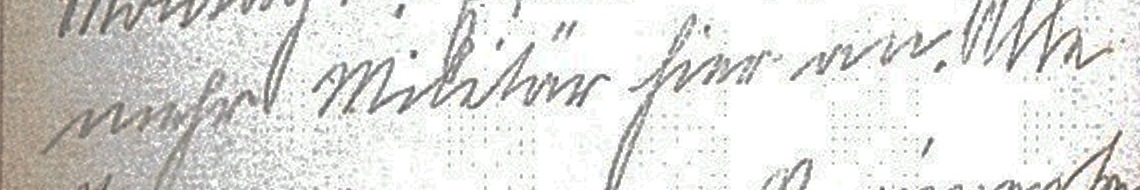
mehr Militär hier an. Alle
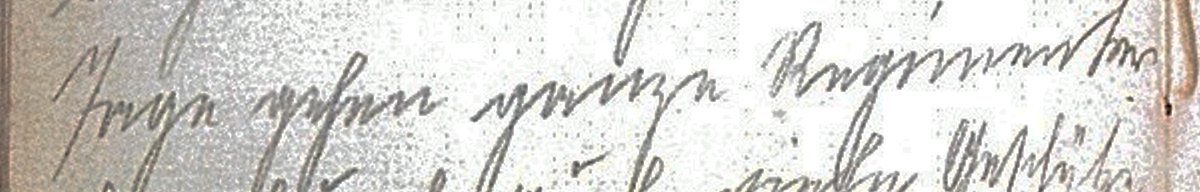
Tage gehen ganze Regimenter
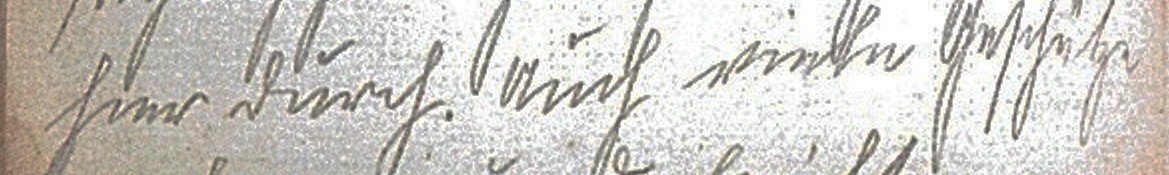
hier durch. Auch viele Geschütze
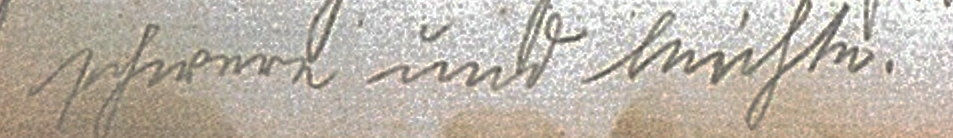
schwere und leichte.
